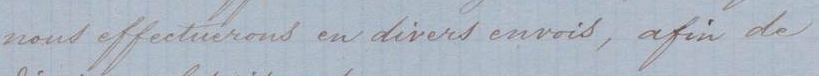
nous effectuerons en divers envois, afin de
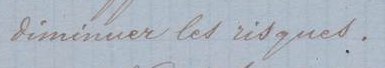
diminuer les risques.
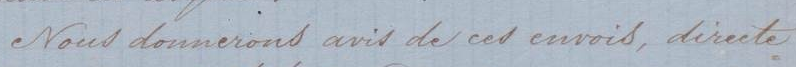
Nous donnerons avis de ces envois, directe-
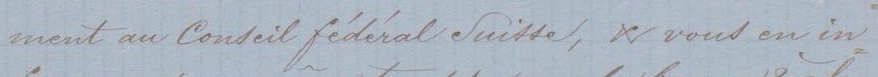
ment au Conseil fédéral Suisse, & vous en in-
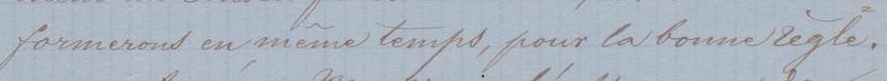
formerons en même temps, pour la bonne régle.
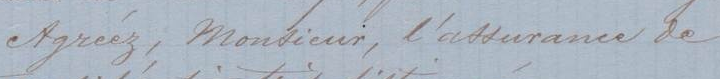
Agréez, Monsieur, l'assurance de
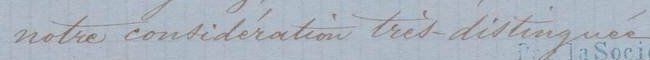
notre considération trés–distinguée
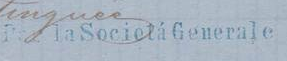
Per La Societá Generale
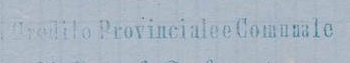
Credito Provinciale e Comunale
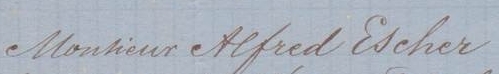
Monsieur Alfred Escher
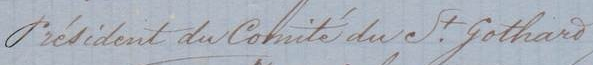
Président du Comité du St Gothard
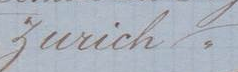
Zurich.
